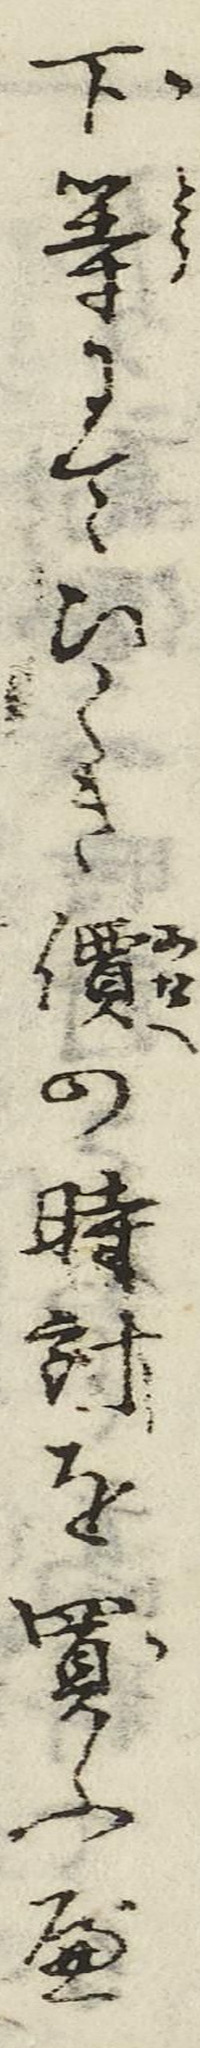下等にてひくき価の時計を買ふべ
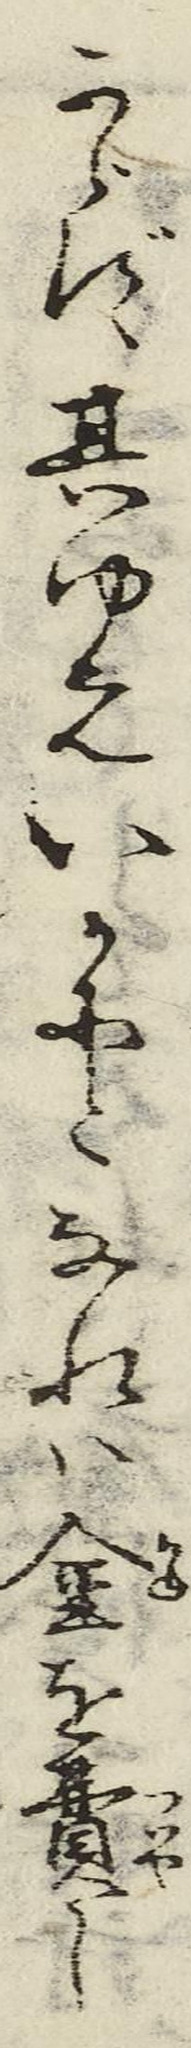からず其ゆえいかにとなれは金を費し
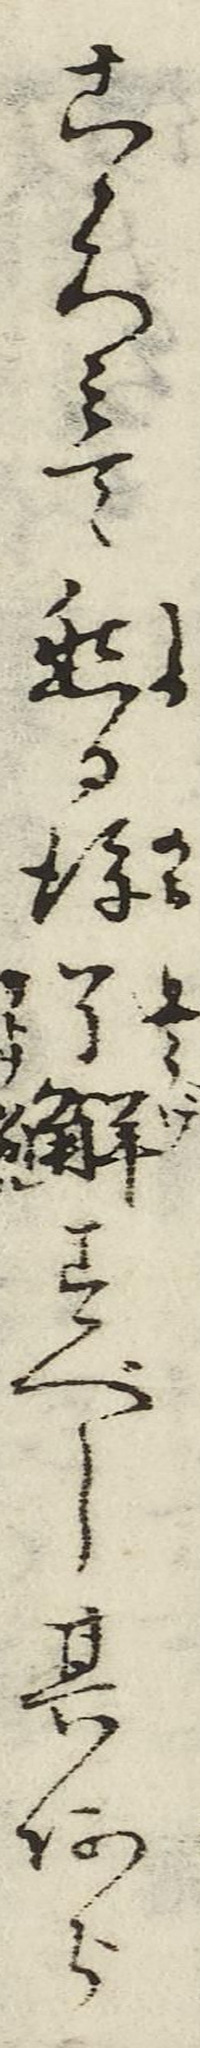こゝろみて然る後了解すべし其あら
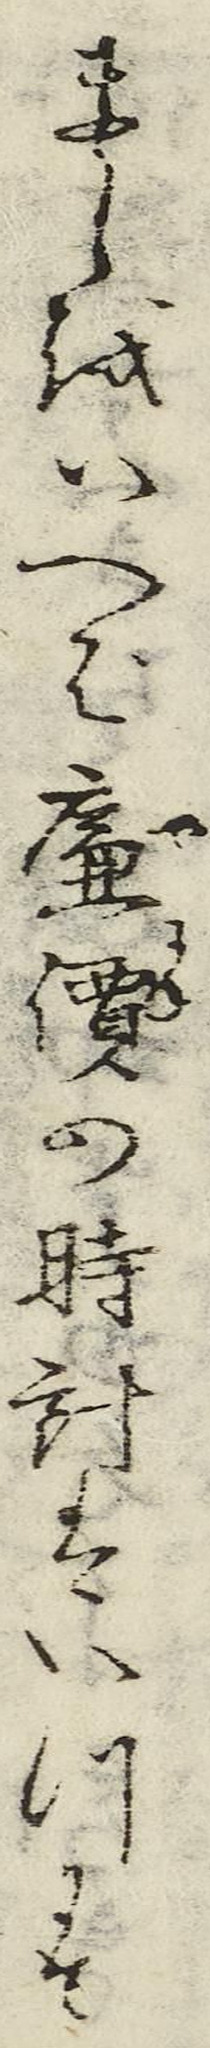ましをいへば廉価の時計はいつにて
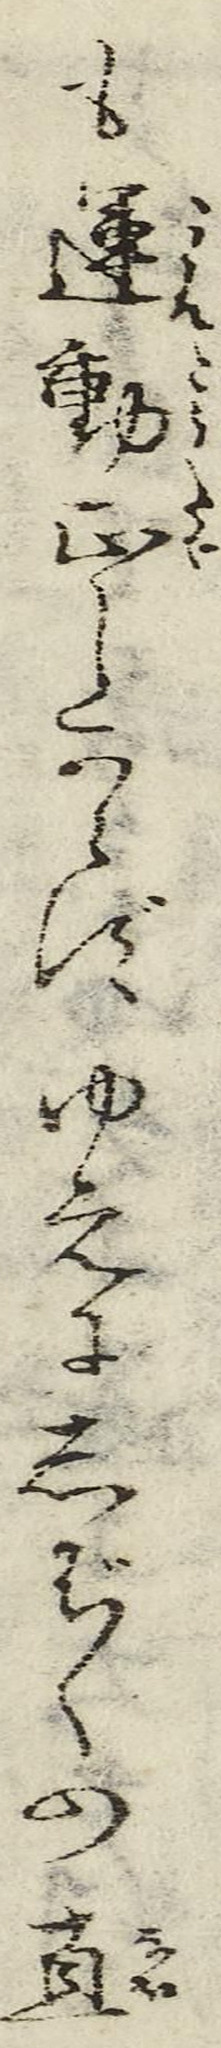も運動正しからずゆえにしば〳〵の直
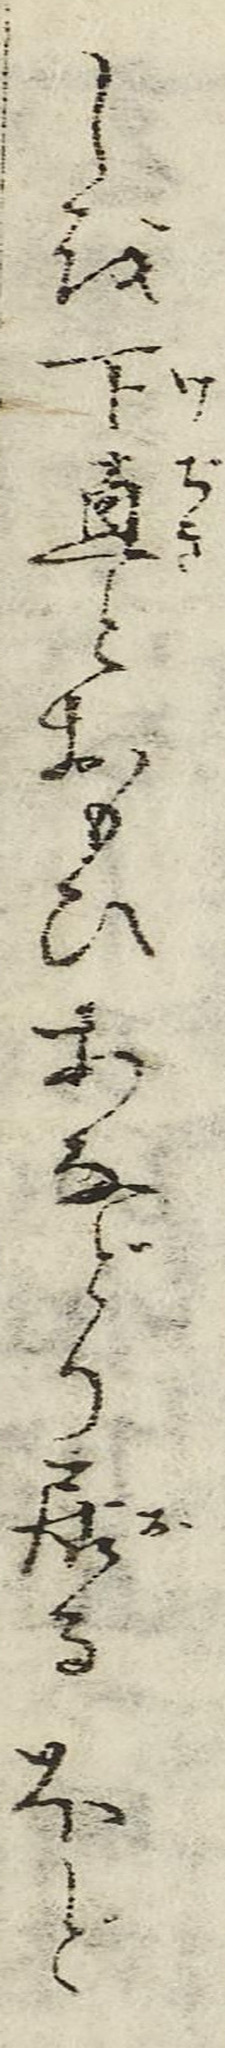しを下直とおもひあなどり居るほど

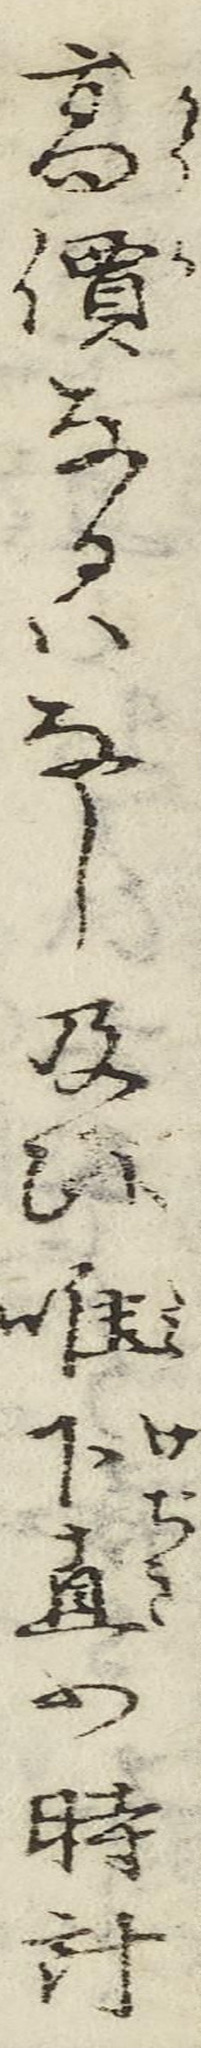高価なるはなし及ひ唯下直の時計
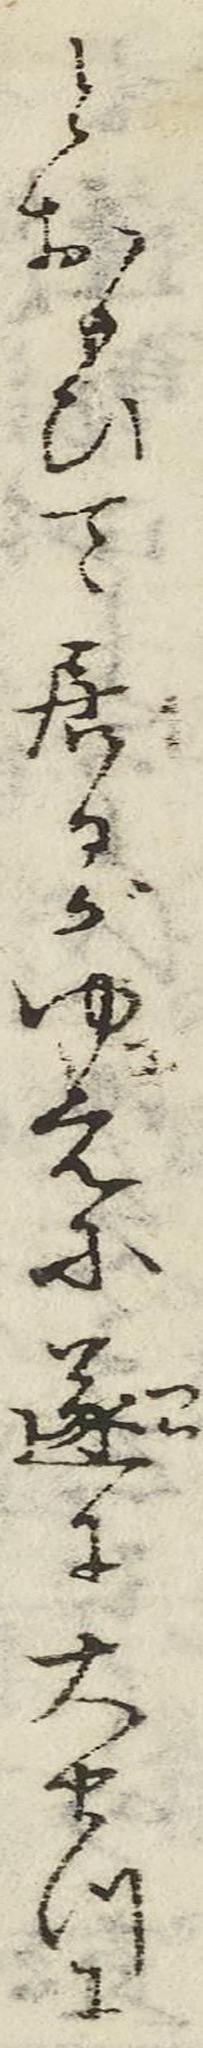とおもひて居るがゆえに遂に大せつに
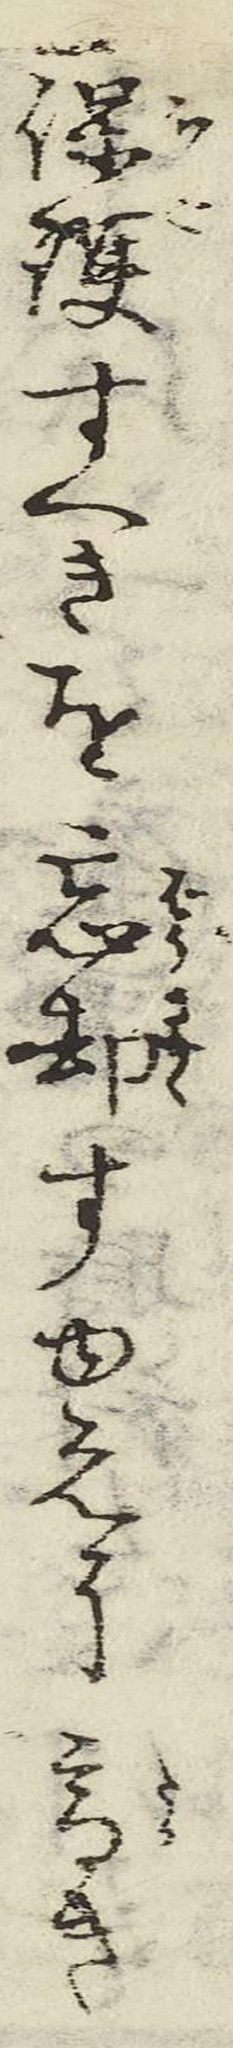保護すへきを忘却すゆえに高き
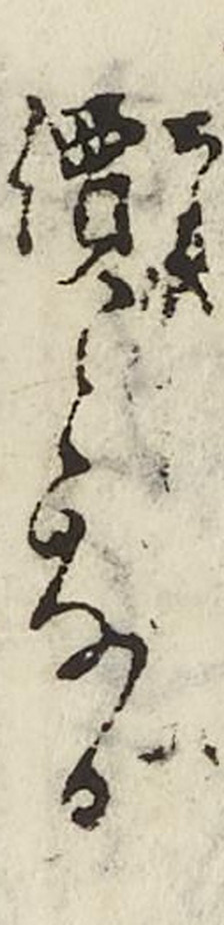価となる
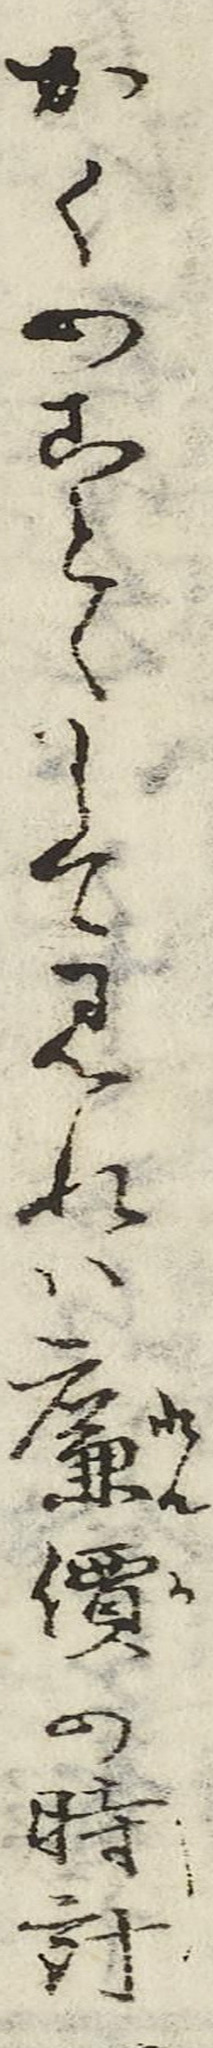かくのことくして見れは廉価の時計
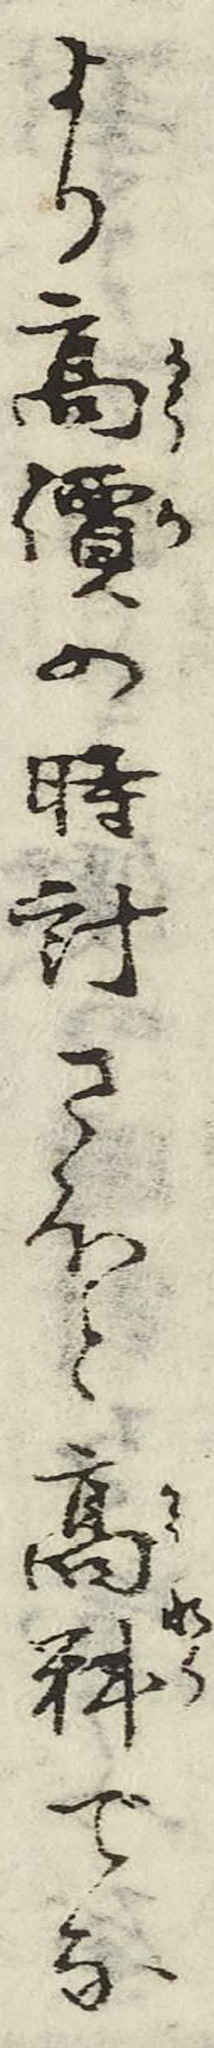より高価の時計さほと高料でな
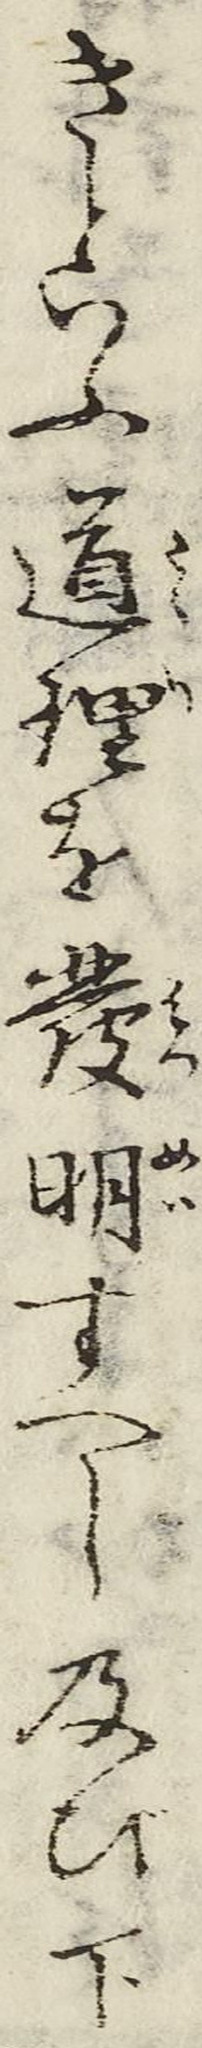きといふ道理を発明すへし及び下
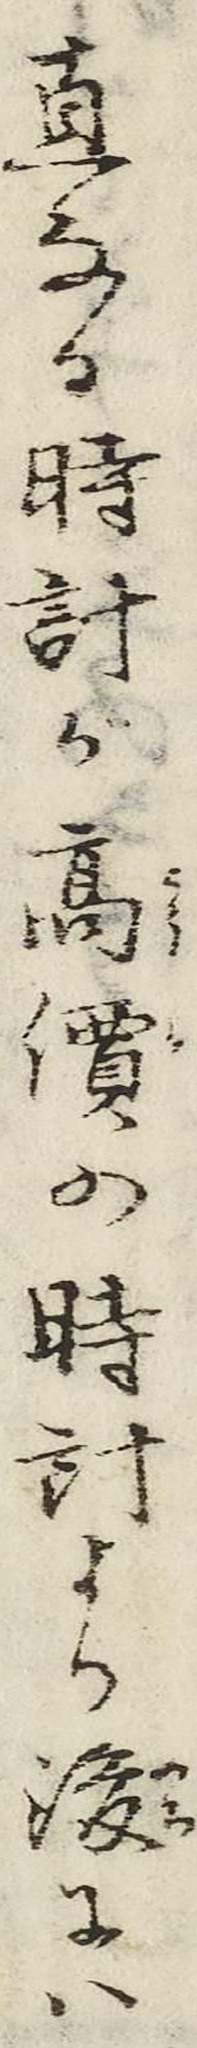直なる時計が高価の時計より後には
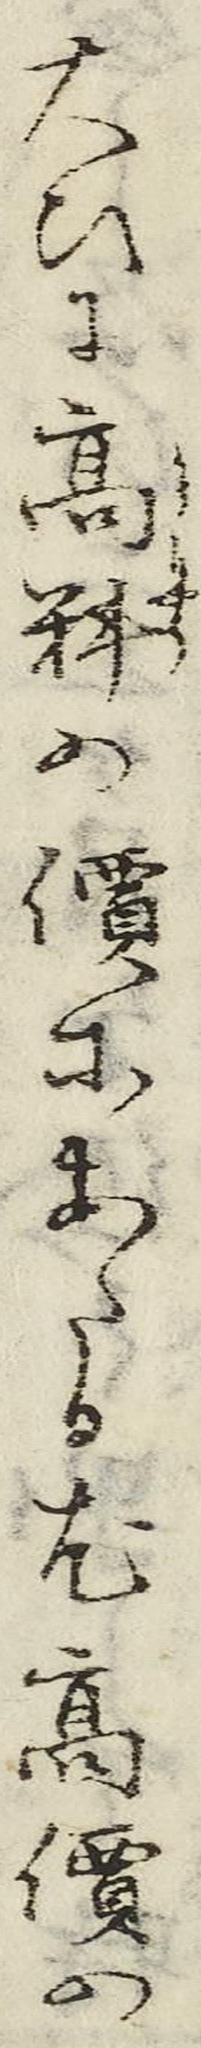大ひに高料の価にあたる尤高価の
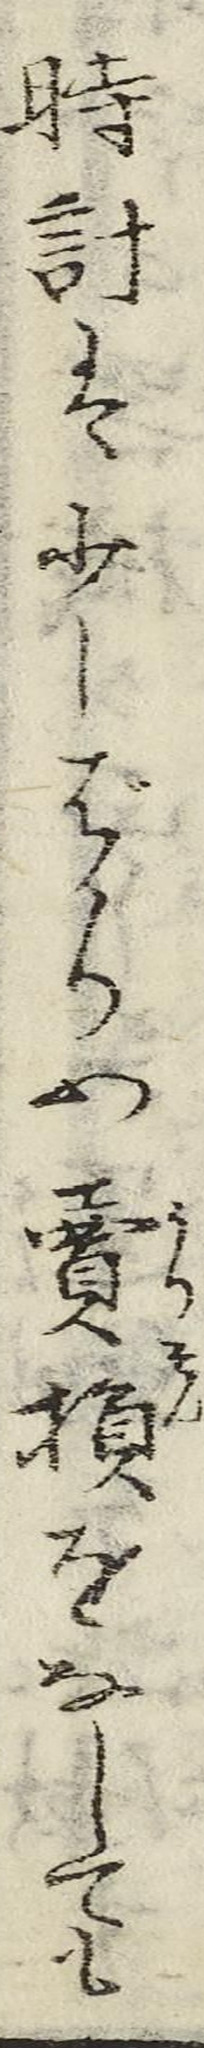時計は少しばかりの売損をなしても
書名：[時計に関する冊子]
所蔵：東京大学地震研究所図書室 Earthquake Research Institute Library, The University of Tokyo, JAPAN
